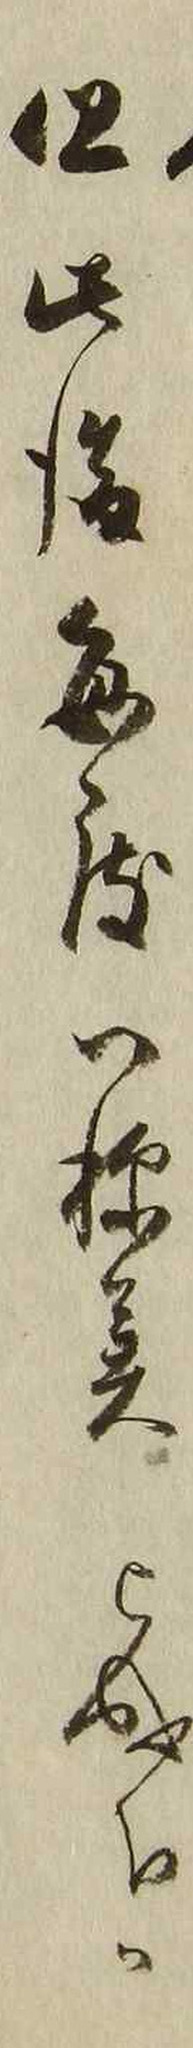但此後毎度御称美被成下候
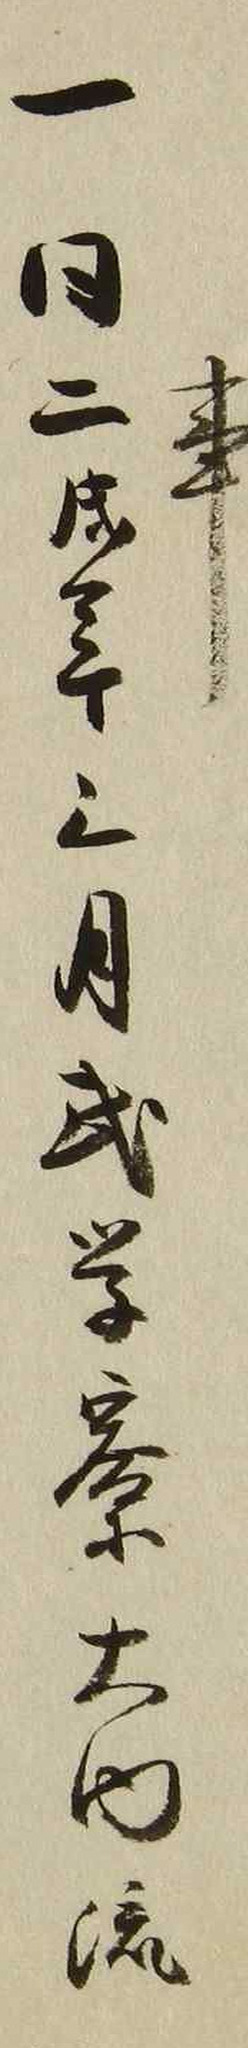一同二戌年三月武学寮大内流
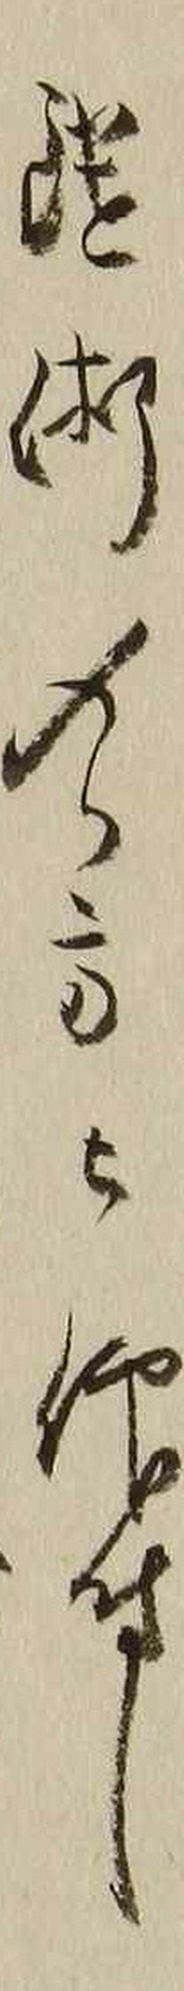鑓術〆り方被仰付候
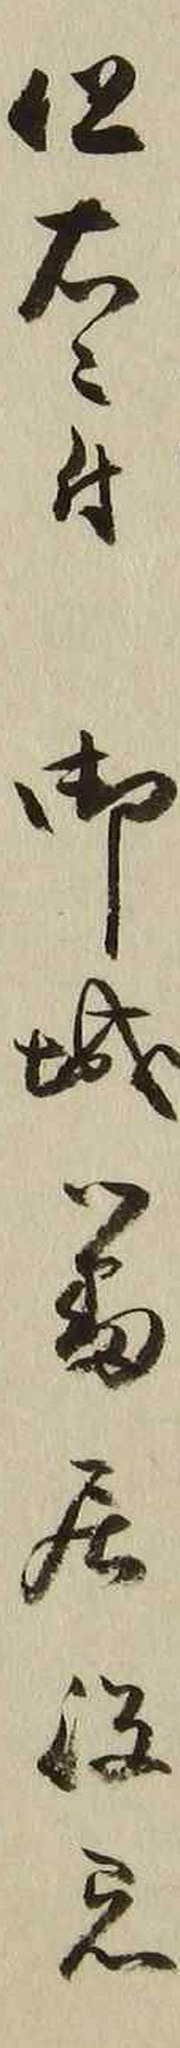但右ニ付御城御番居役着
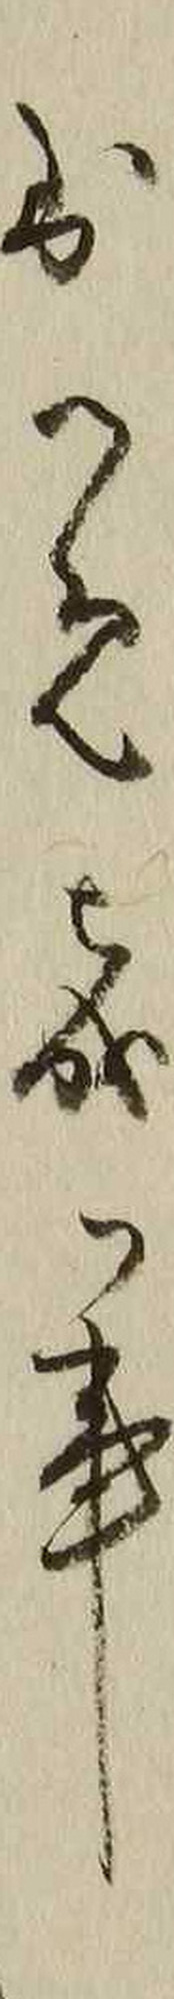到御免被成候事
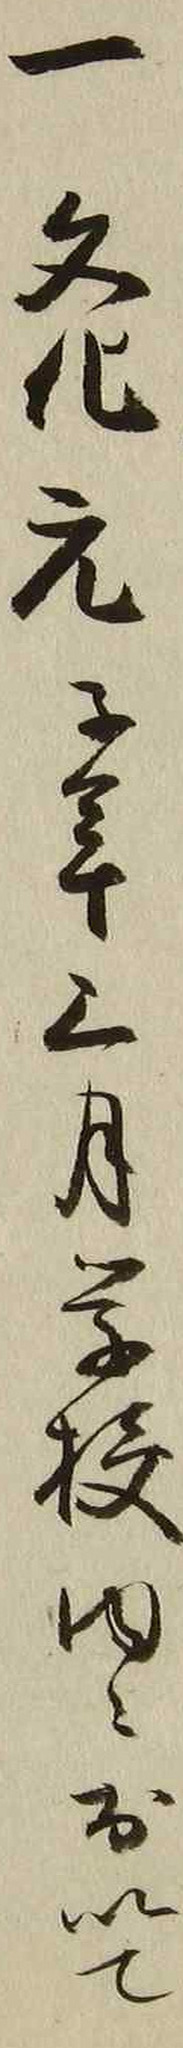一文化元子年三月学校内ニおいて
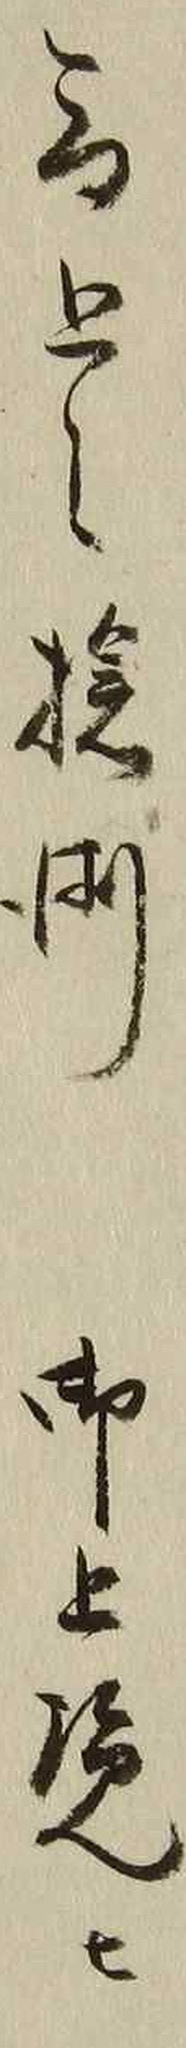馬上之槍術御上覧被
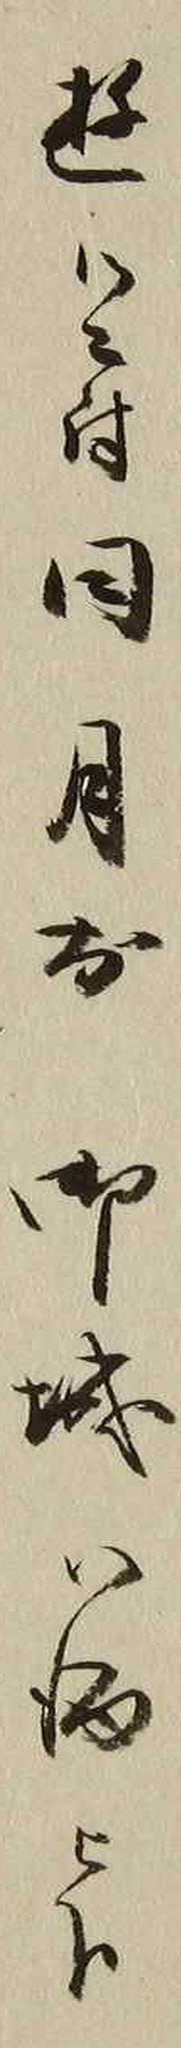遊候ニ付同月於御城御酒被下
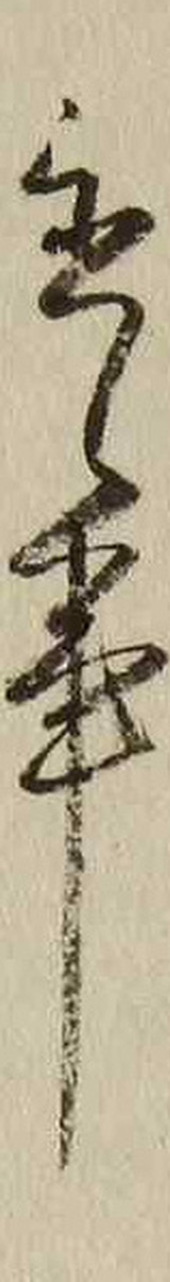置候事
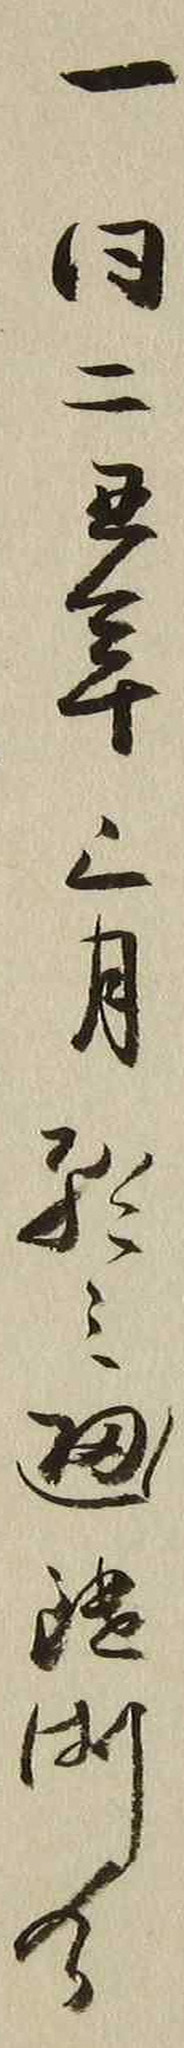一同二丑年三月願之通鑓術〆り
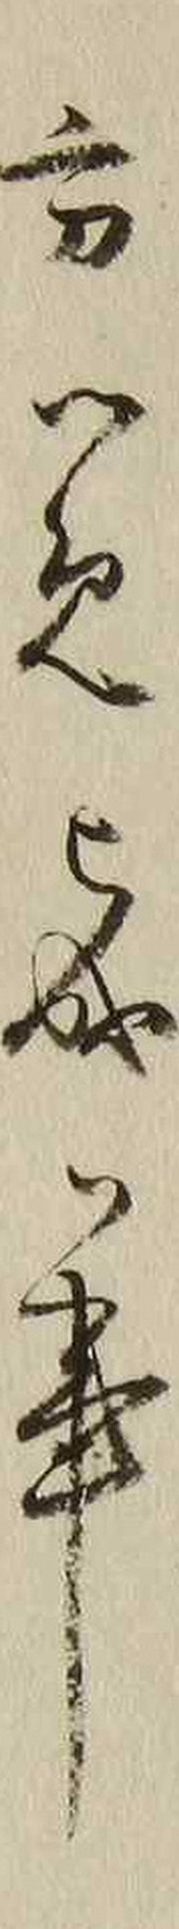方御免被成候事
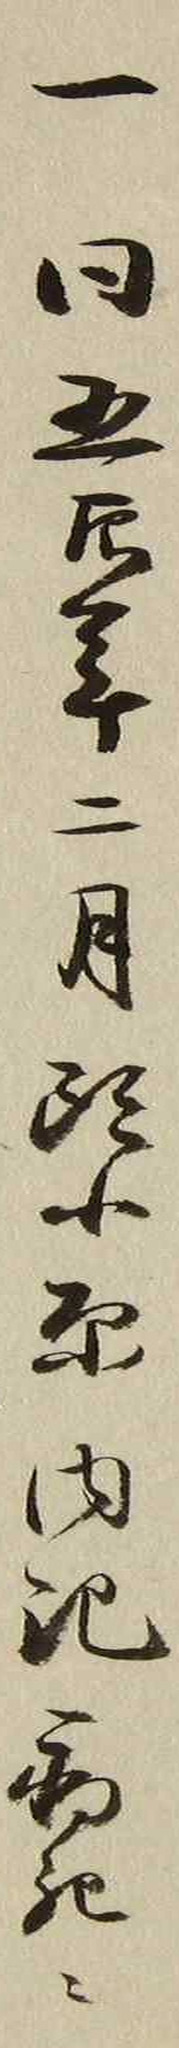一同五辰年二月頭小原内記病死ニ
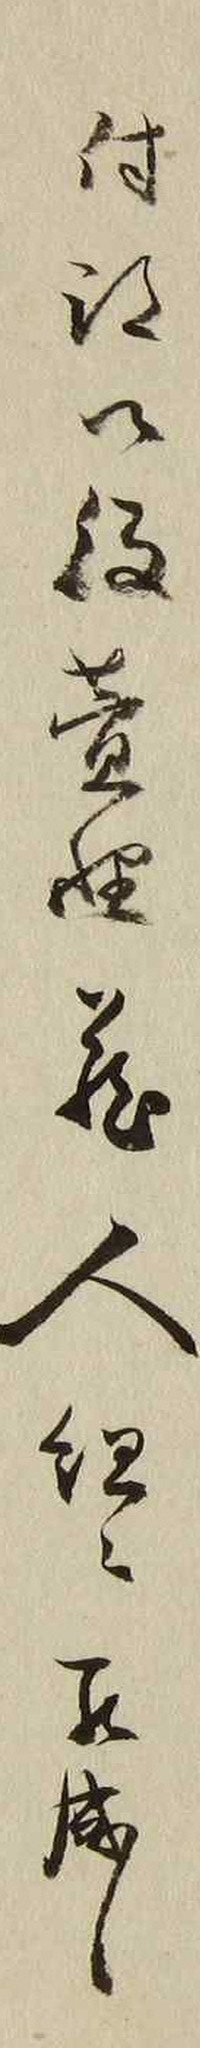付跡御役萱野蔵人組ニ罷成候
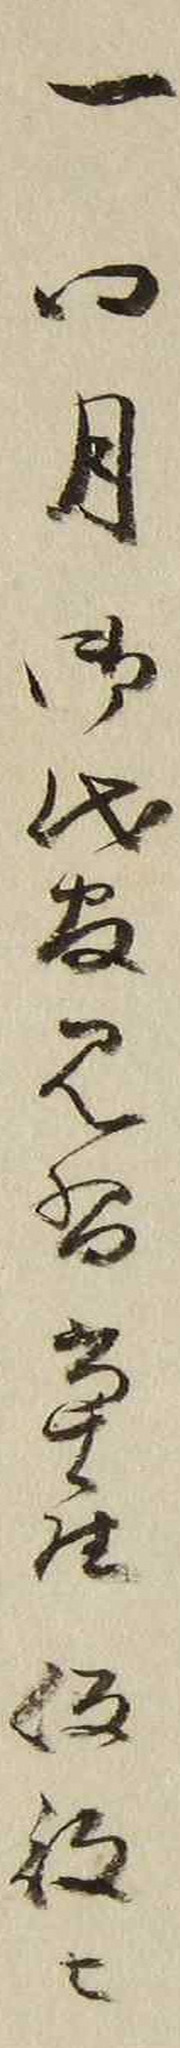一同月御代官見習当座仮役被
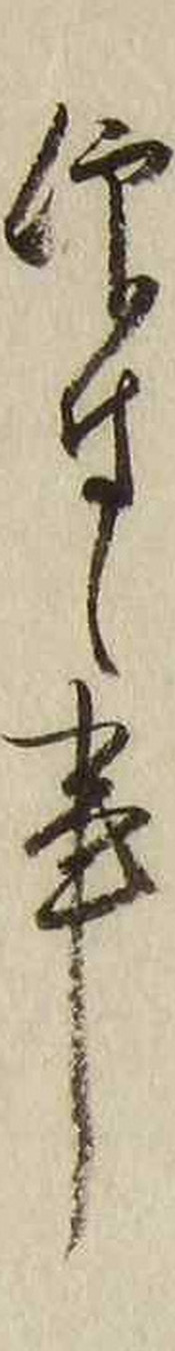仰付候事
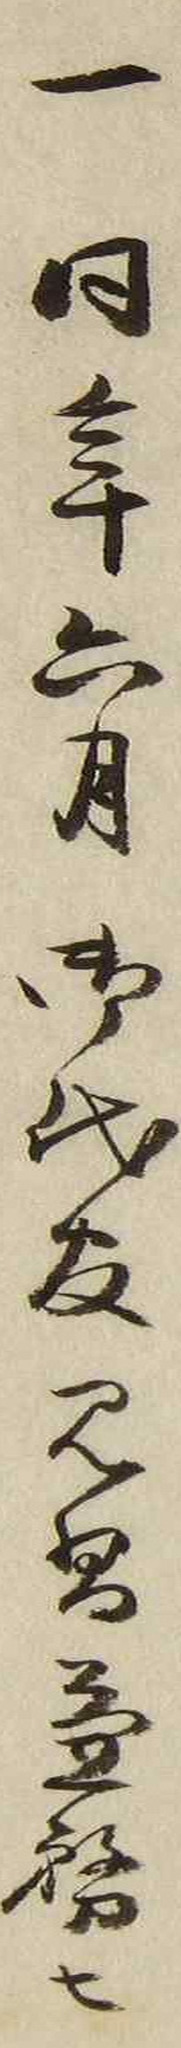一同年六月御代官見習兼務被
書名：諸士系譜　巻之288　さ之部20
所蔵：会津若松市立会津図書館
